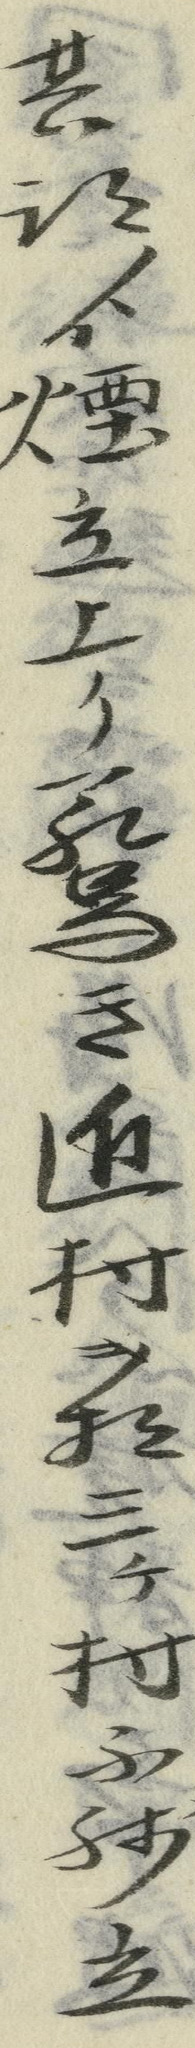其跡ゟ煙立上リ驚き近村弐拾三ケ村不残立
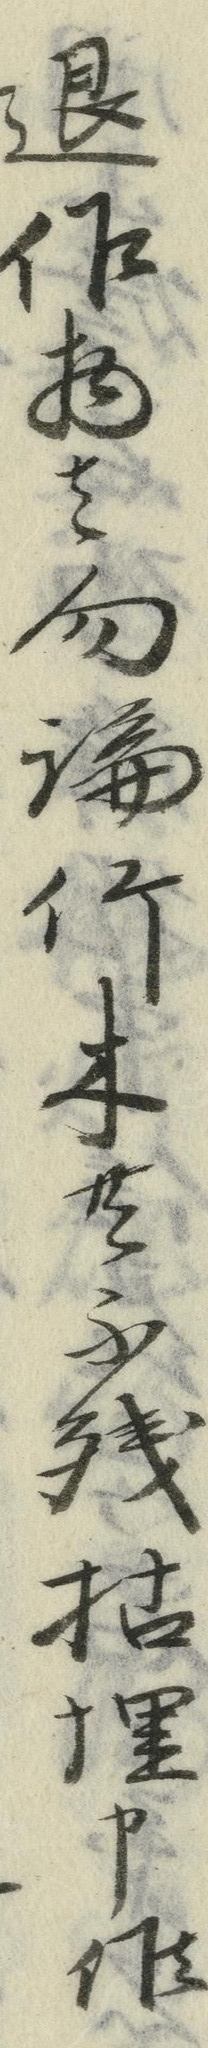退作物は勿論竹木共不残枯埋申候
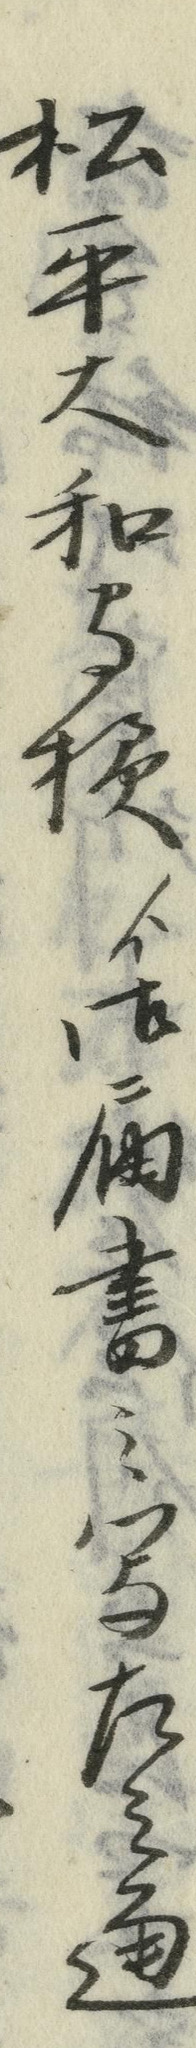一松平大和守様ゟ御届書之写左之通
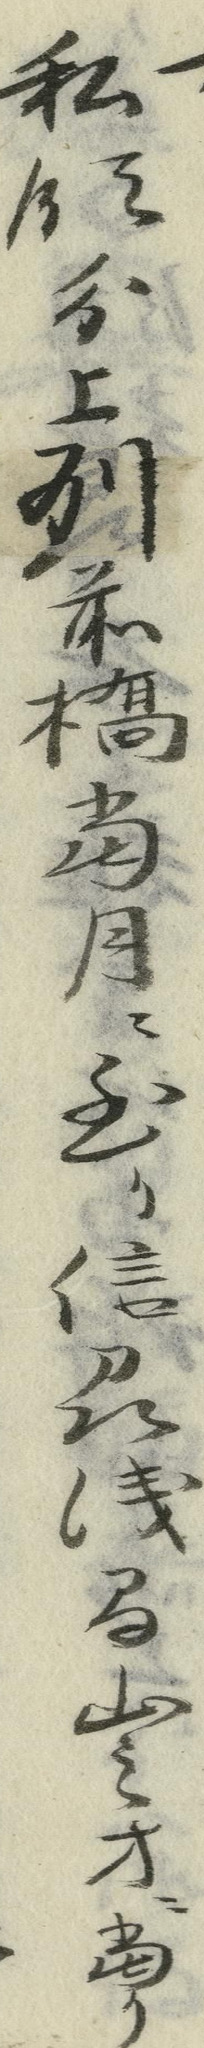私領分上州前橋当月ニ至リ信州浅間山之方ニ当リ
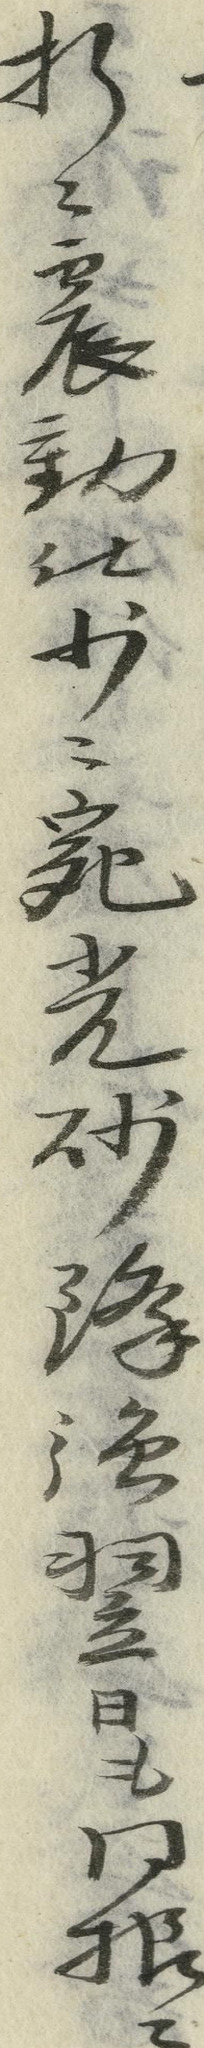折々震動仕少々宛光砂降強翌日も同様ニ
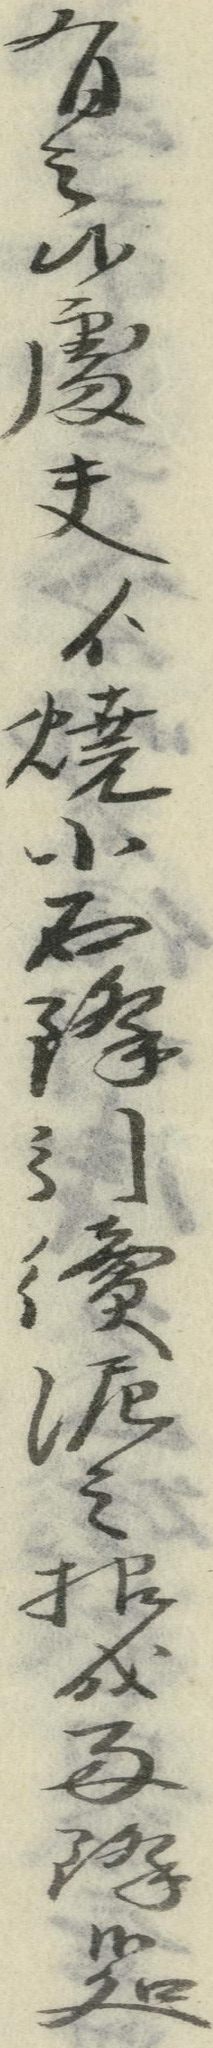有之候処夫ゟ焼小石降引続泥之様成雨降候処
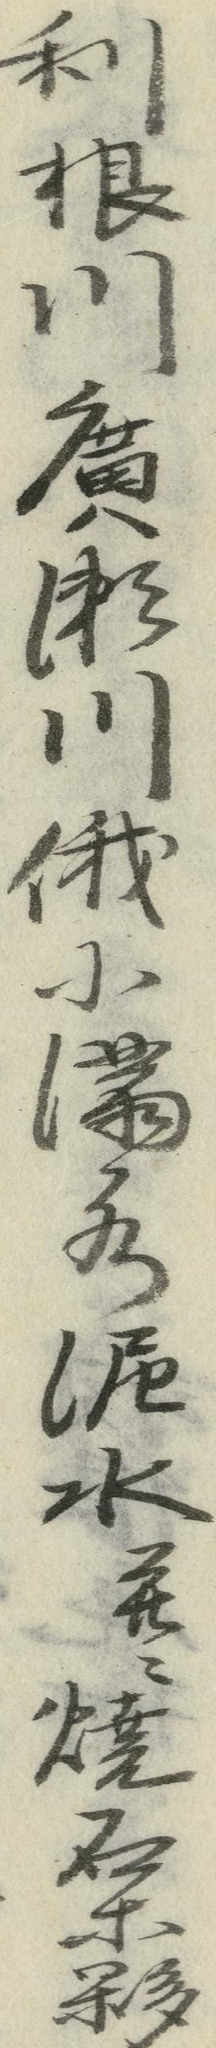利根川広瀬川俄に満水泥水并ニ焼石等夥
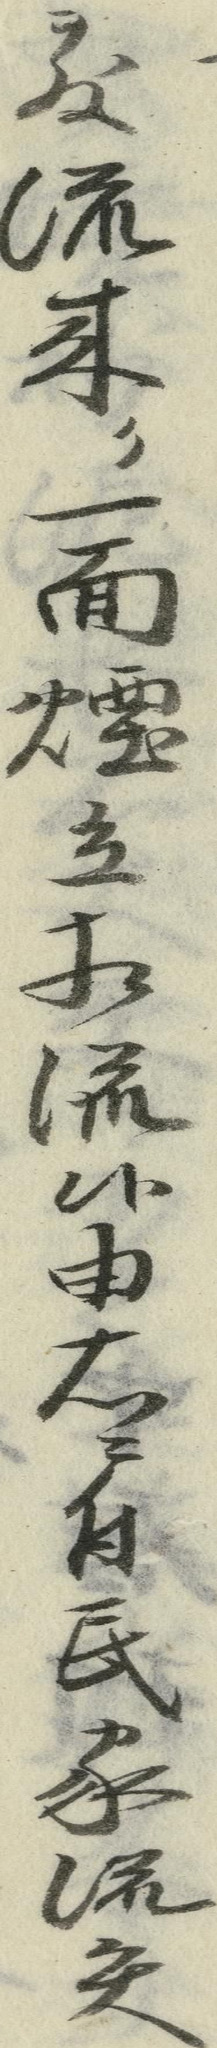敷流来リ一面煙立相流候由右ニ付民家流失
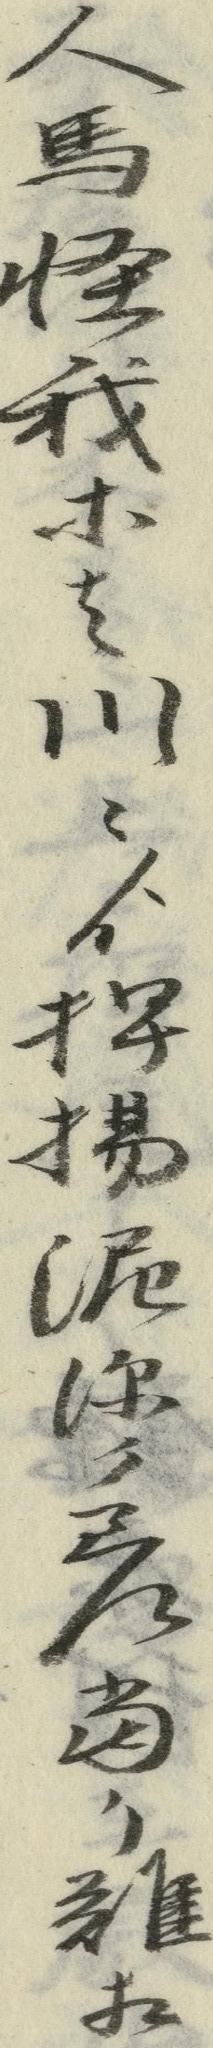人馬怪我等は川々ゟ押揚泥深ク差当リ難相
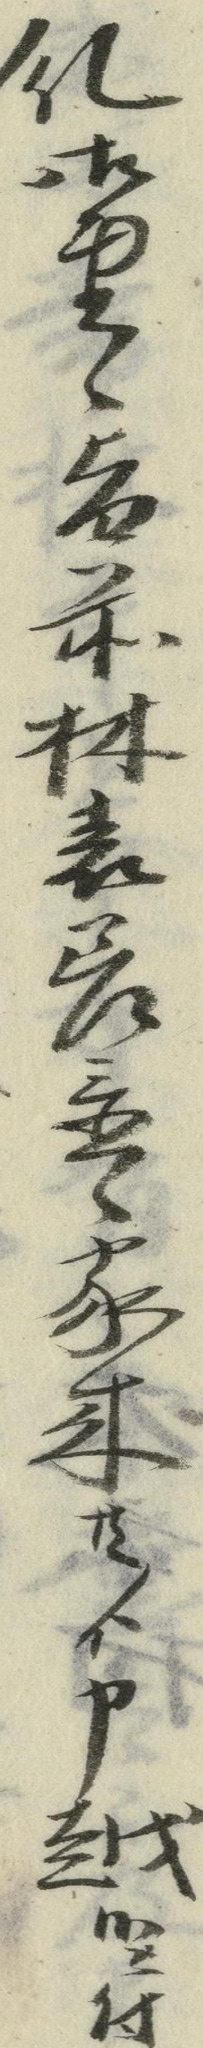糺御座候旨前林表差置候家来共ゟ申越候ニ付
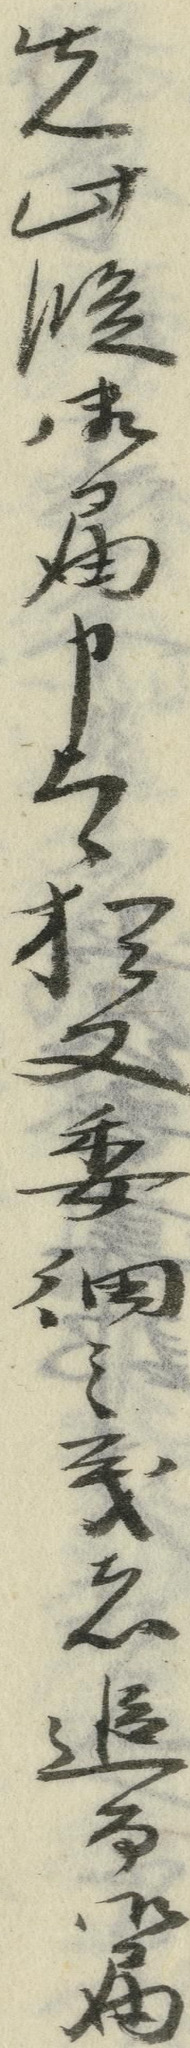先此段御届申上候猶又委細之義は追而御届
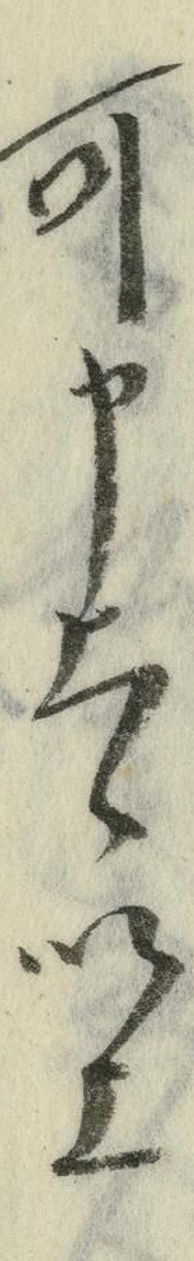可申上候以上
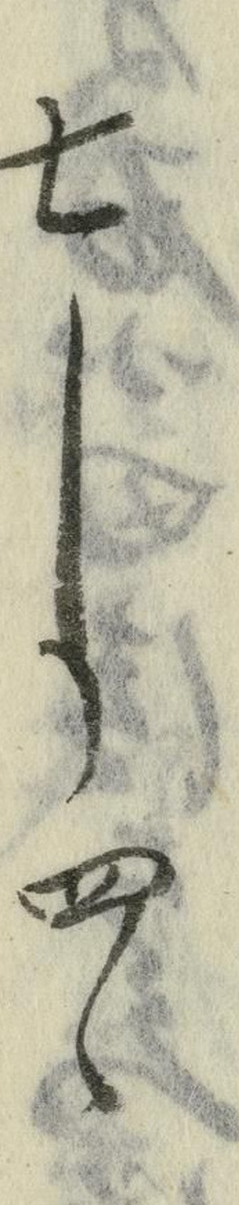七月四日
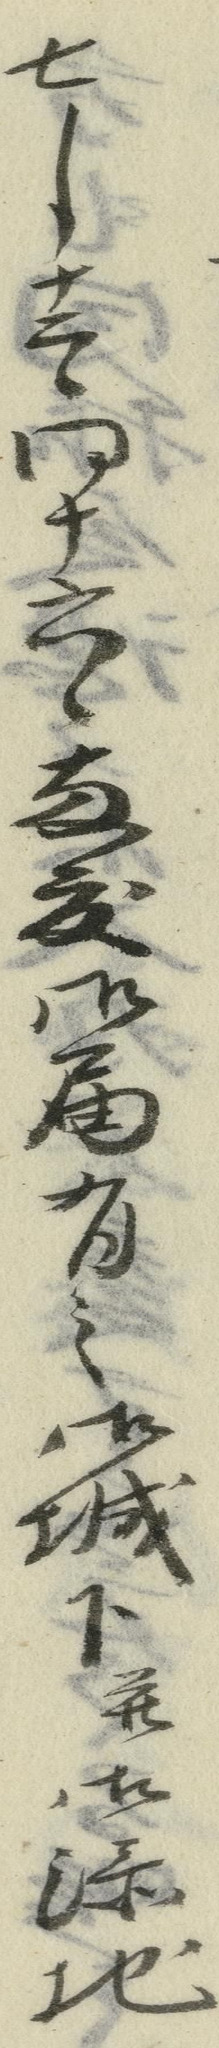七月十二日同十六日両度御届有之御城下并御添地
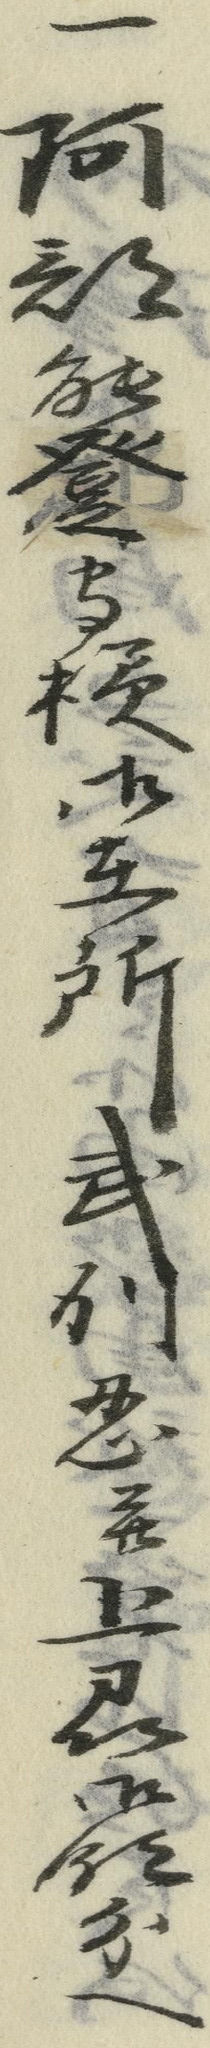一阿部能登守様御在所武州忍并上州御領分へ

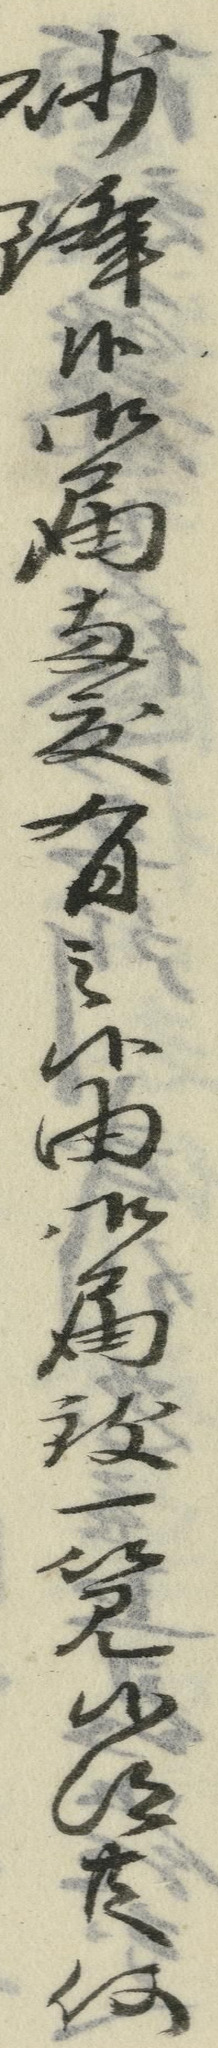砂降候御届両度有之候由御届致一覧候得共何
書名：天明三癸卯七月信州浅間山焼出シ上州山津浪ニ付近國ヨリ御届書并訴書写
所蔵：東京大学地震研究所図書室 Earthquake Research Institute Library, The University of Tokyo, JAPAN
